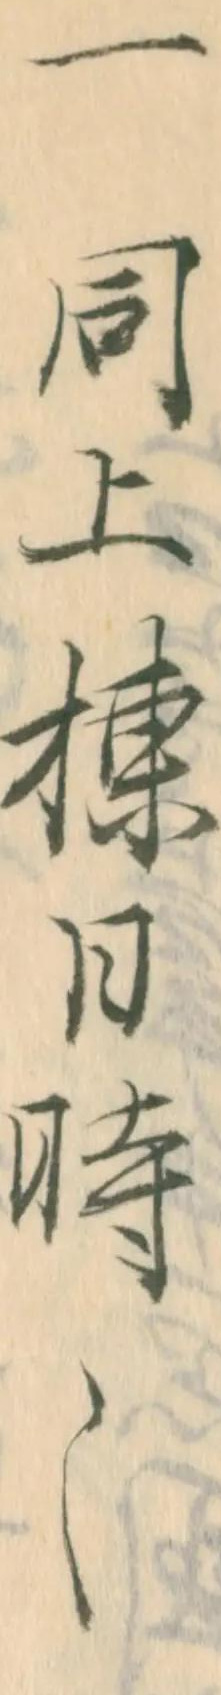一同上棟日時ーー
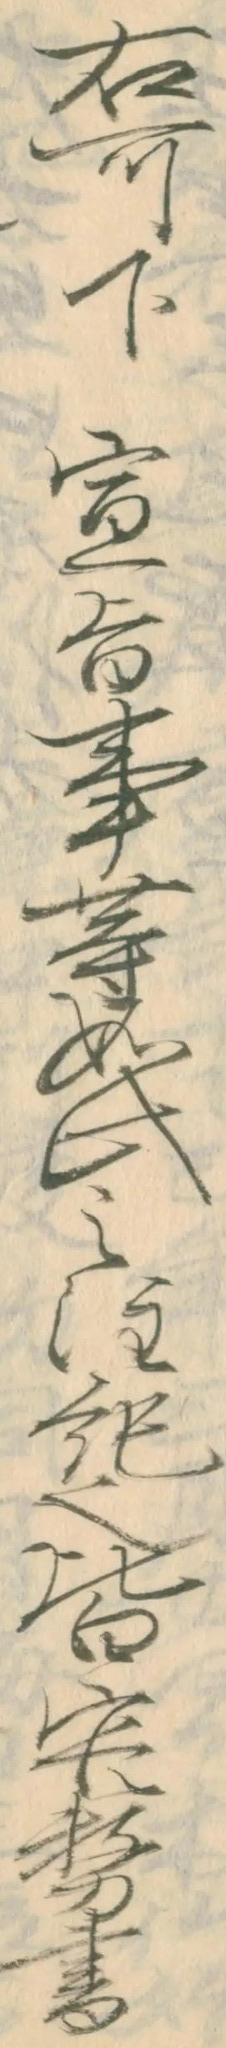右可下宣旨事等如此之注記也皆官務書
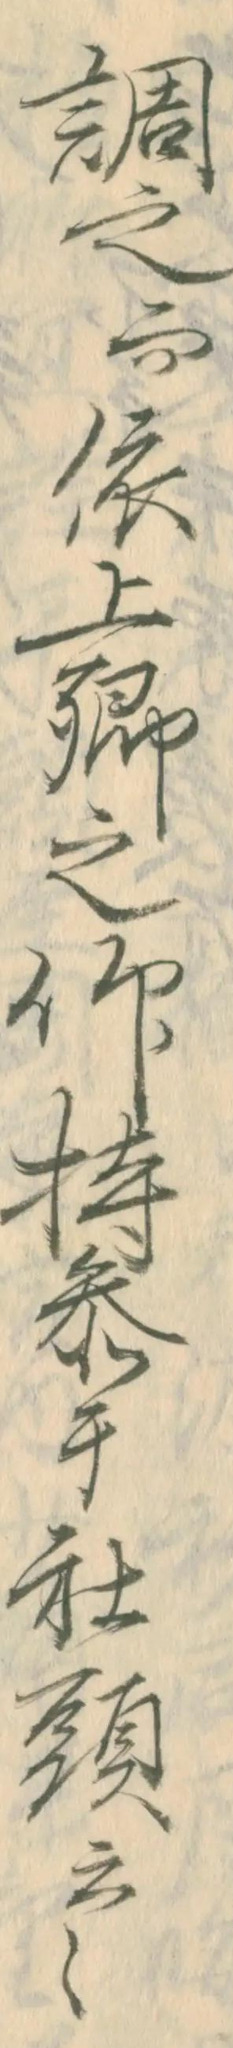調之而依上卿之仰持参于社頭云々
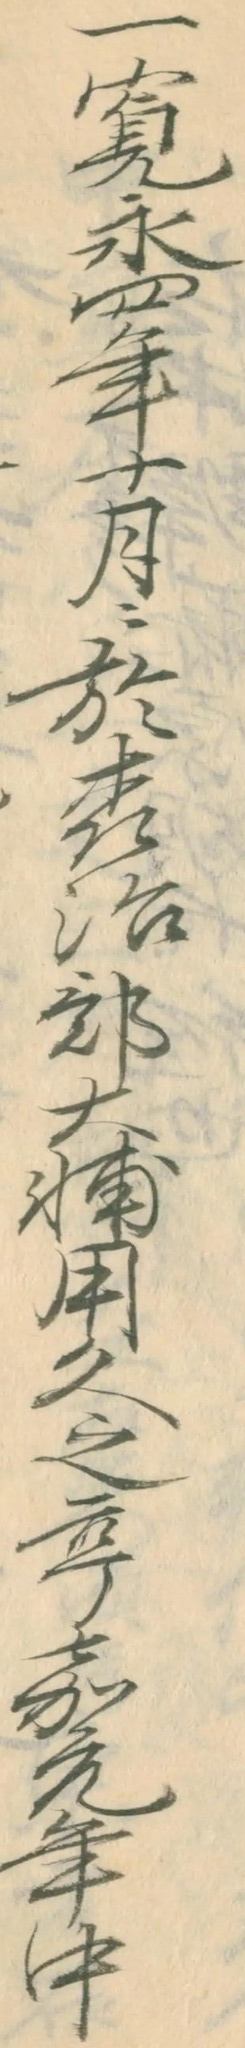一寛永四年十月ニ於森治部大輔用久之亭嘉元年中
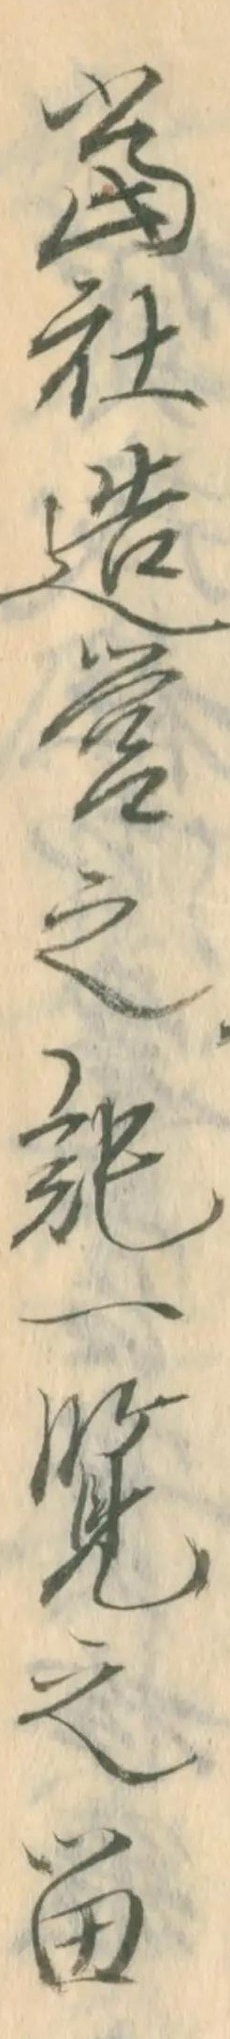当社造営之記一覧之留

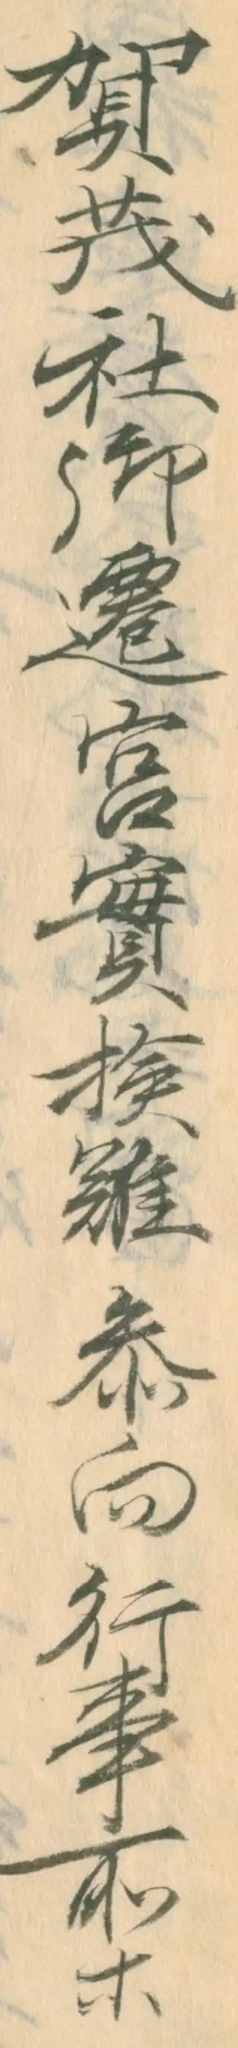賀茂社御遷宮実検難参向行事所等
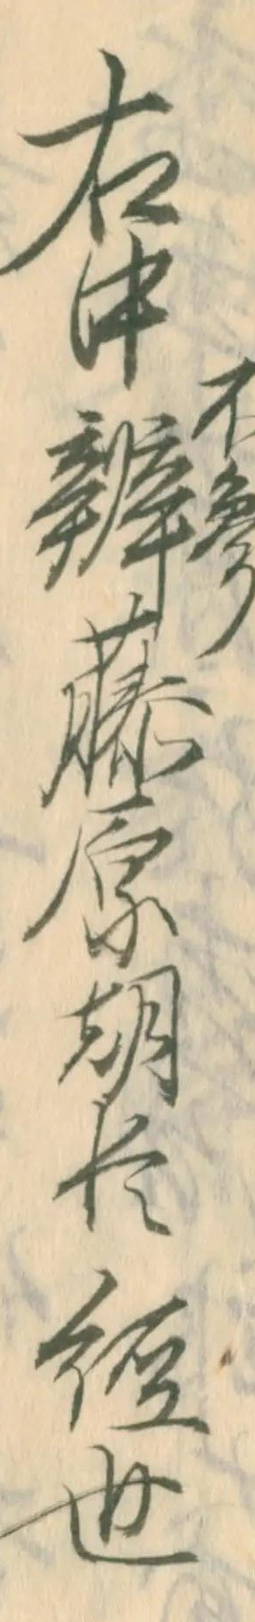右中弁藤原朝長経世
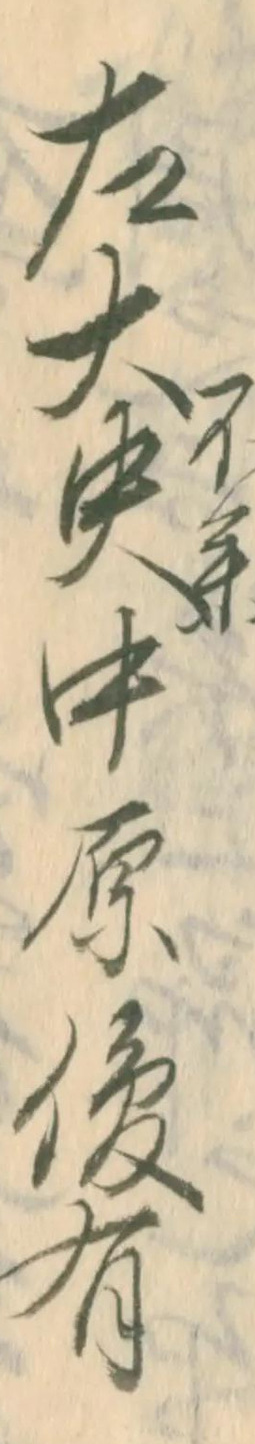左大史中原俊有
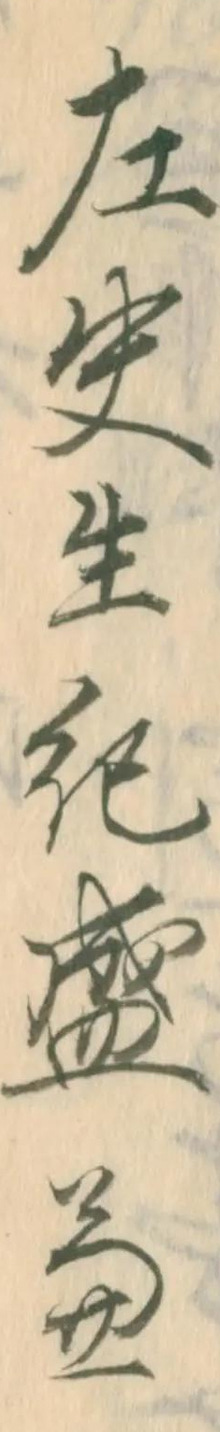左史生紀盛兼
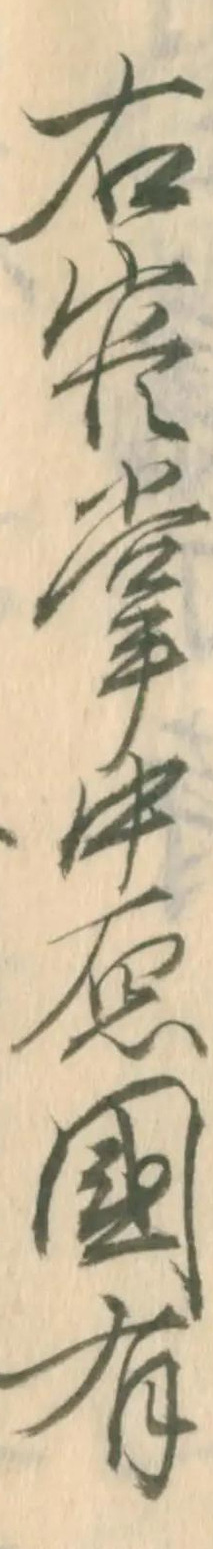右官掌中原国有
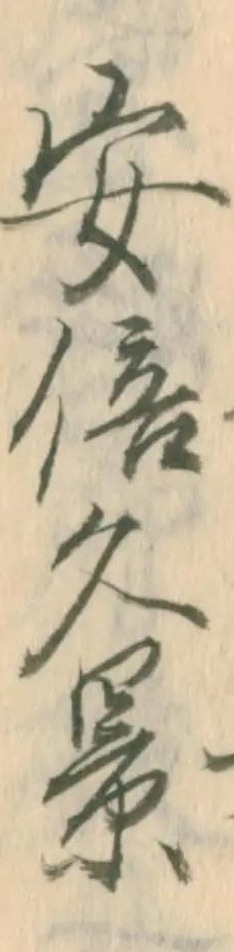安倍久景
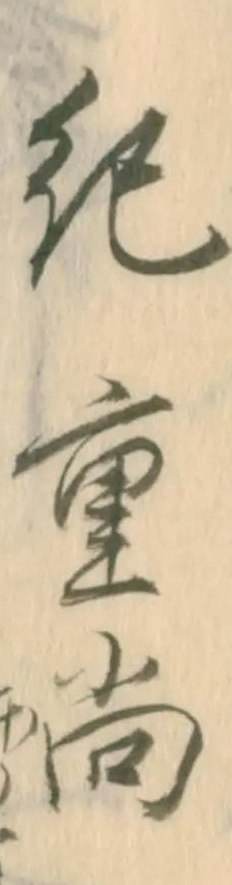紀重尚
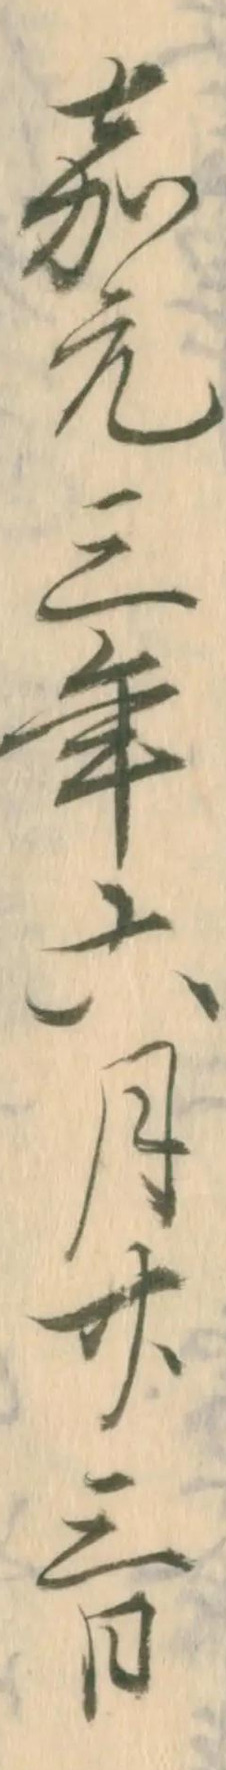嘉元三年六月廿三日
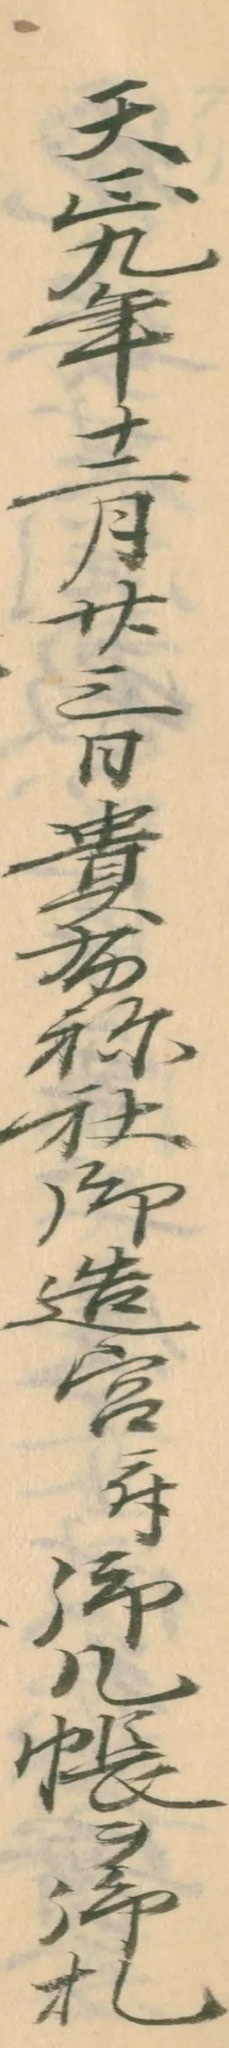一天正九年十二月廿三日貴布祢社御造宮ニ付御几帳ヲ御札
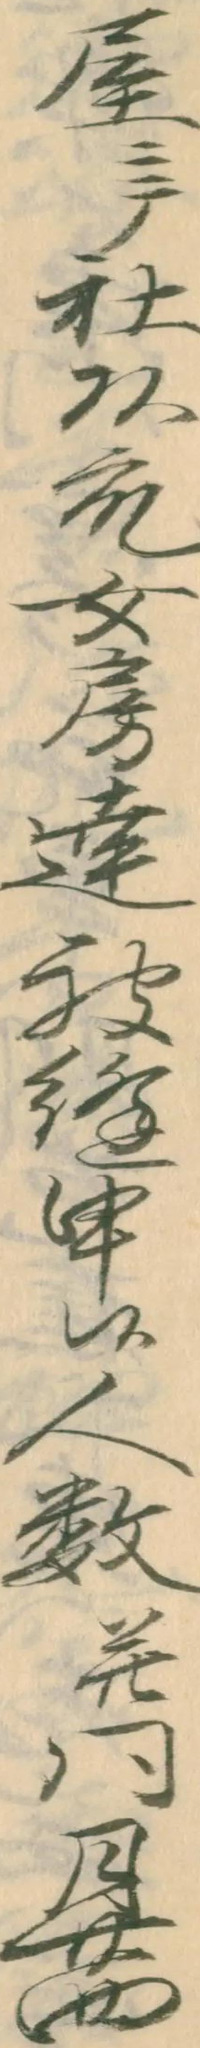屋ニテ社頭衆女房達被縫申候人数并同月廿四
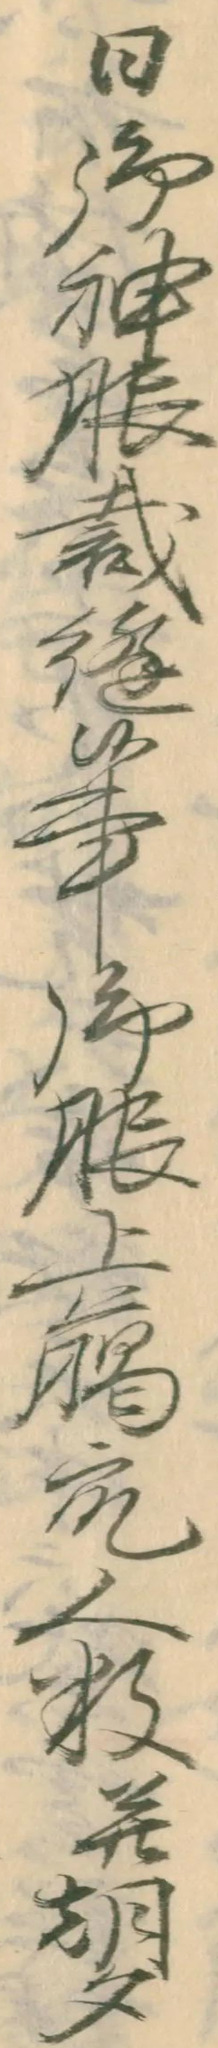日御神服裁縫候事御服上臈衆人数并朝夕
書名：賀茂社記録. 第15冊
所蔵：国立国会図書館 National Diet Library, JAPAN
